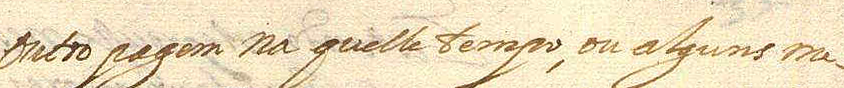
outro pagem naquelle tempo, ou alguns me
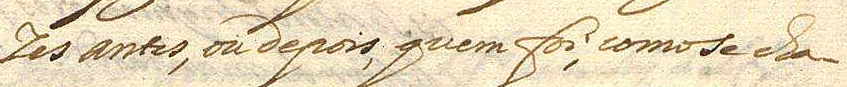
zes antes, ou depois, quem foi, como se cha
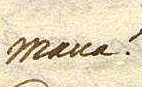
maua?
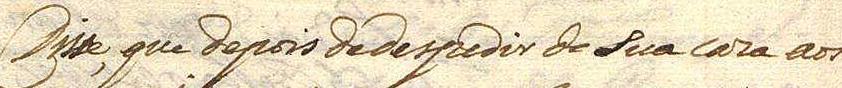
Disse, que depois de despedir de sua caza aos
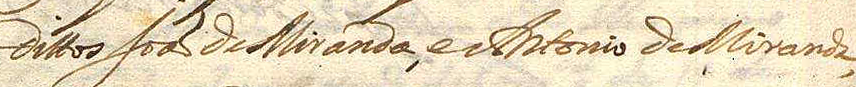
dittos Joaõ de Miranda, e Antonio de Miranda,
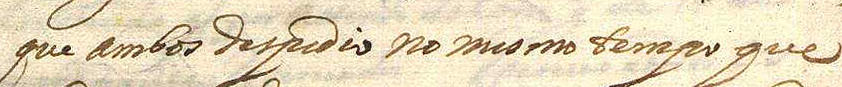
que ambos despedio no mesmo tempo que
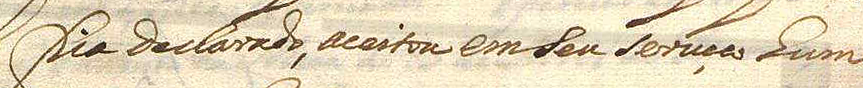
fica declarado, aceitou em seu seruiço hum
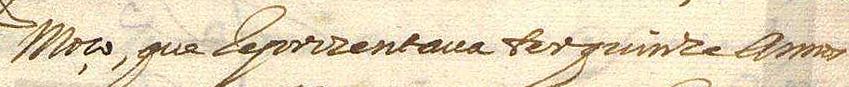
Moço, que Reprezentaua ter quinze annos
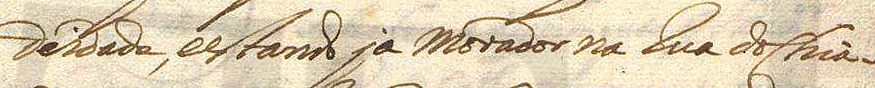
de idade, estando ja morador na Rua do Chia
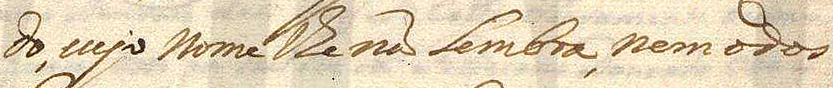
do, cujo nome lhe naõ lembra, nem o dos
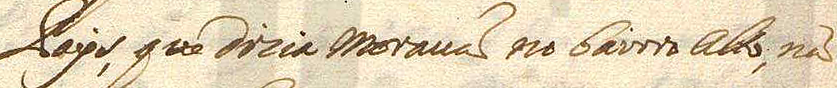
Pays, que dizia morauaõ no bairro alto, naõ
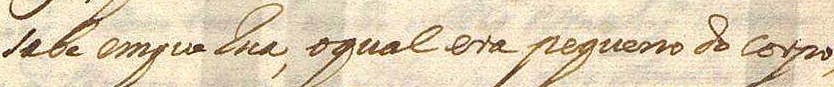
sabe em que Rua, o qual era pequeno do corpo,
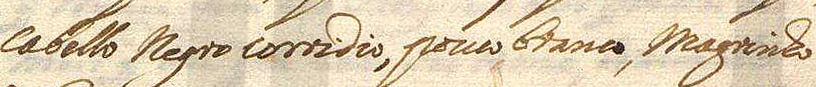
cabello negro corridio, pouco branco, magrinho
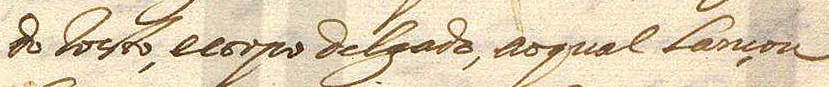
do Rosto, e corpo delgado, ao qual Lançou
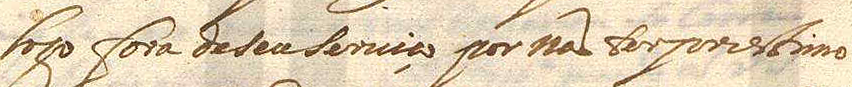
logo fora de seu seruiço por naõ ter prestimo
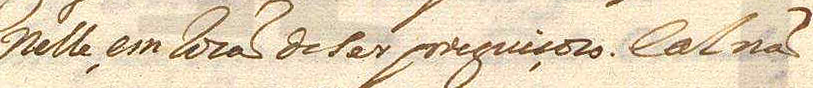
nelle, em Rezaõ de ser preguiçozo. e al naõ
